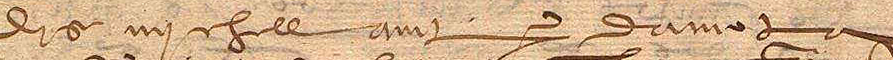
djse nychell amto da mota
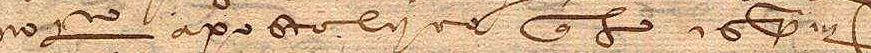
notro apostolyco q̄ ho esp̄uj
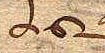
testa
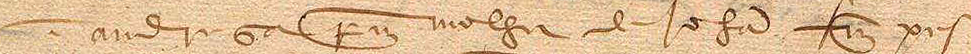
item andresa p̄iz molher de Johā fr̄z pes
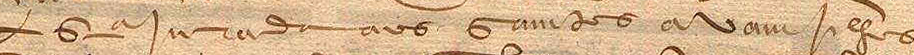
testa Jurada aos samtos avamLelhos
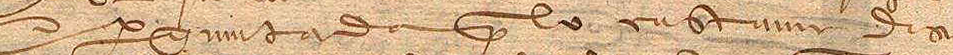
e ꝑgumtada p̄lo custume dise
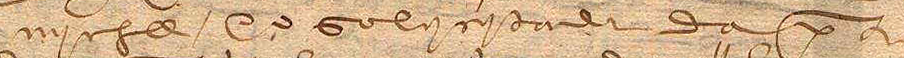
nychell / e o solycytador da p̄te
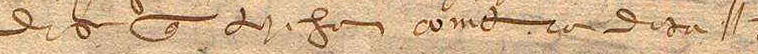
djse q̄ tynha comtradita //
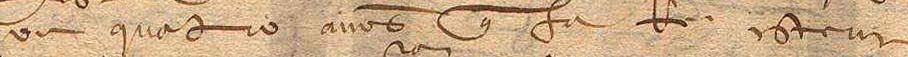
ou quatro anōs q̄ ha Re esteue
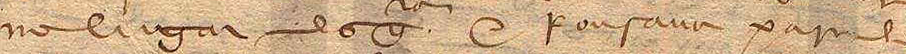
no lugar desgra e pousaua parede
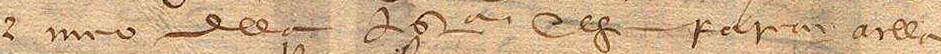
ē meo della testa e lhe parece a ella
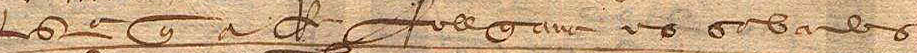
testa q̄ a Re follgaua os sabados
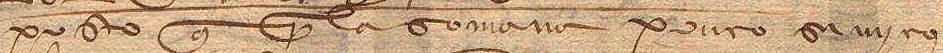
posto q̄ p̄la somana pouco seruyço
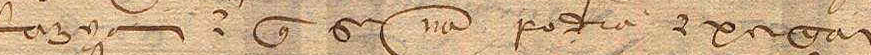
fazya ē q̄ se nā podia ēxergar
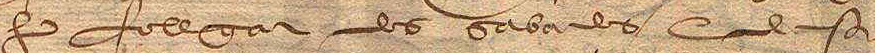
ho follgar dos sabados / e deste
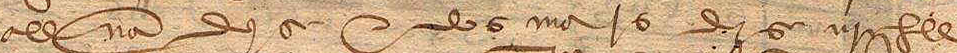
all na dyse e dos maJs djse njchell
